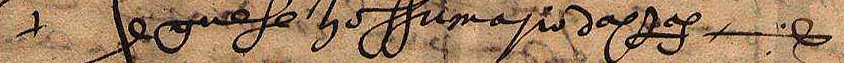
Seguese ho ssumario das tas
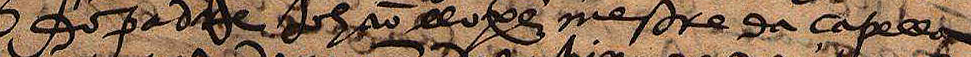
do padre Johaõ llopez̄ mestre da capella
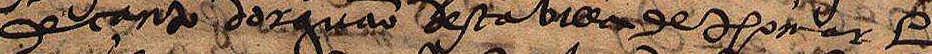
de çanto darguão desta villa de thomar E
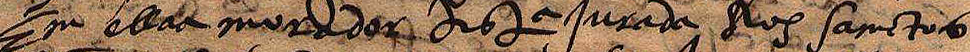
Em ellaa morador testa Jurada Aos samctos
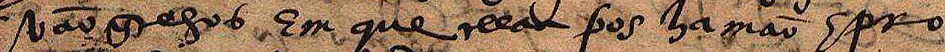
Evãogelhos Em que ellaa pos ha maõ E pro
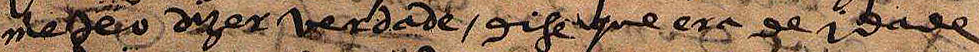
meteo dizer verdade / dise que era de idade
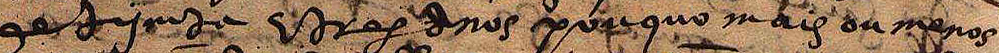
de trjmta E tres Anos pouquo mais ou menos
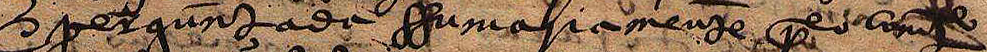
e pergūntada ssumariamente p̄lo comtdo
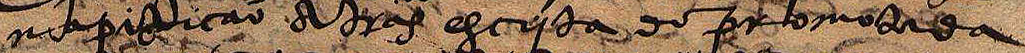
na pitiçaõ Atras escrjta do promotor da
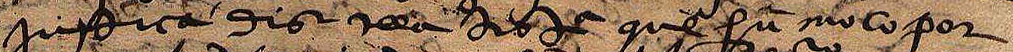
Justica dise ella testa que hū moco por
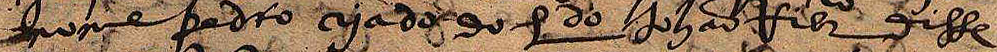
nome pedro crjado do Ldo Johão Ribro disse
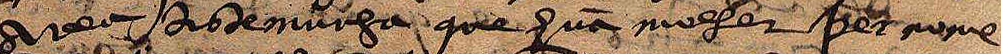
A ella testemunha que huā molher per nome
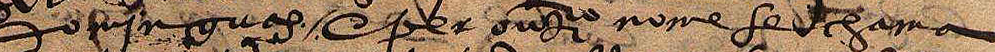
domjnguas ./. e per outro nome se chama
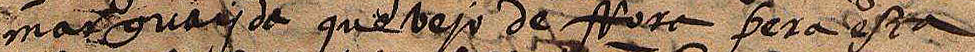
marguarjda que vejo de ffora pera esta
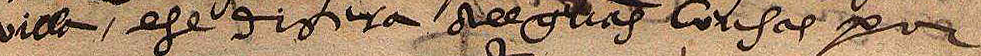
villa, lhe disera Allguās Cousas por
